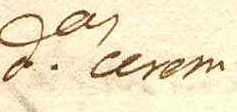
d.as cerem.
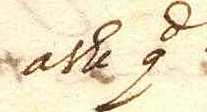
athe q.do
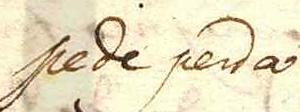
pede perdaõ
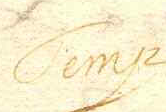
Temp
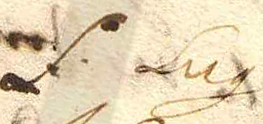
L. Lug
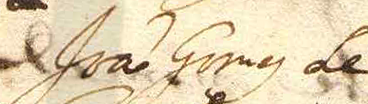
Joaõ Gomes de
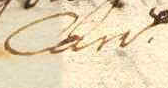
Carv.o
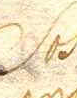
Sos
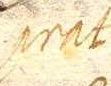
prat.
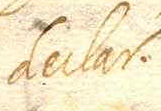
declar.
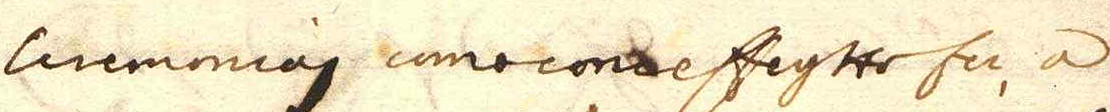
ceremonias como com effeytto fez, a
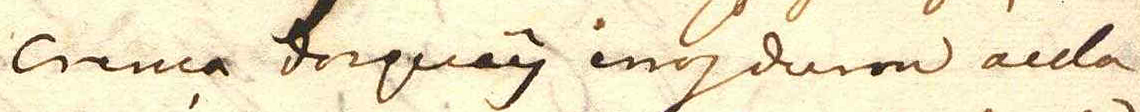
crença dos quaês erros durou a ella
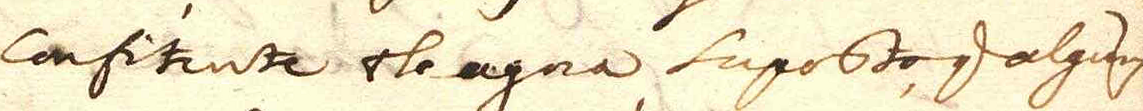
confitente the agora, suposto, q̄ alguns
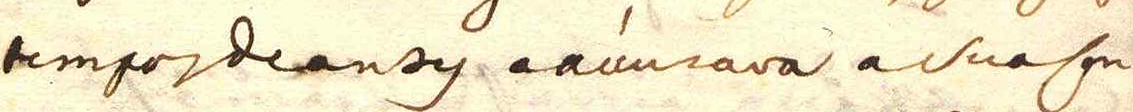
tempos de antes a accuzava a sua Con
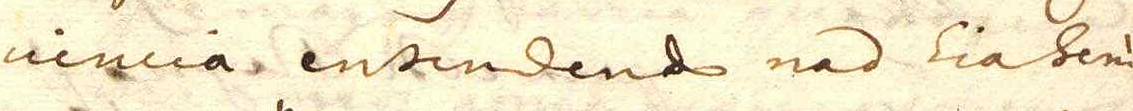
ciencia, entendendo naõ hia bem
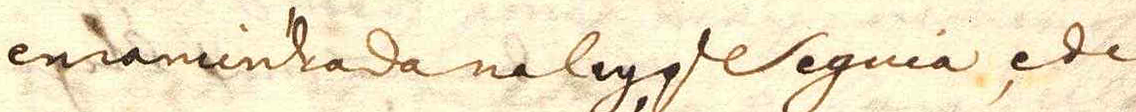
encaminhada na ley, q̄ seguia, e de
